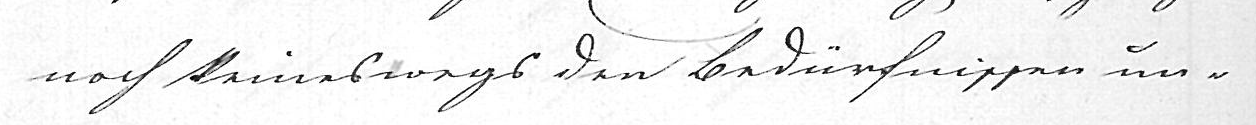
noch keineswegs den Bedürfnissen un-
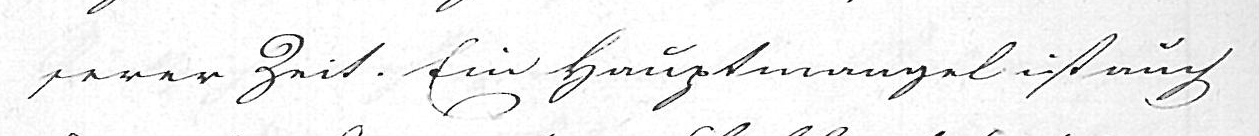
serer Zeit. Ein Hauptmangel ist auch
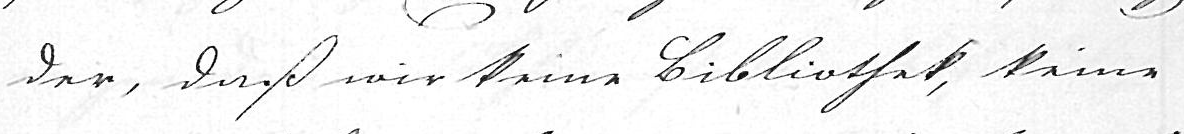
der, daß wir keine Bibliothek, keine
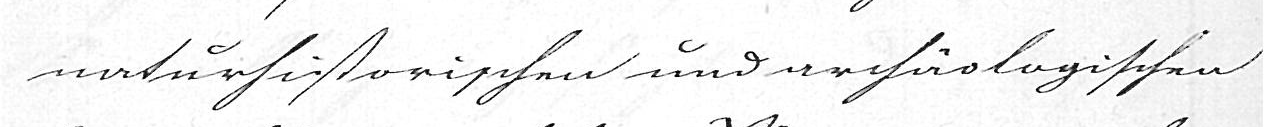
naturhistorischen und archäologischen
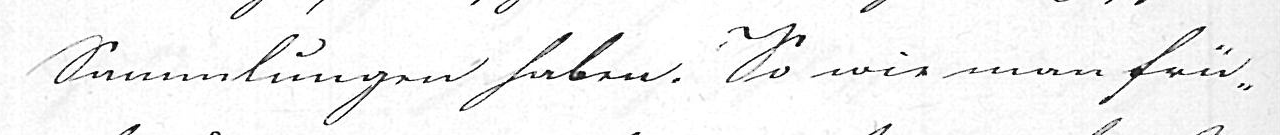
Sammlungen haben. So wie man frü-
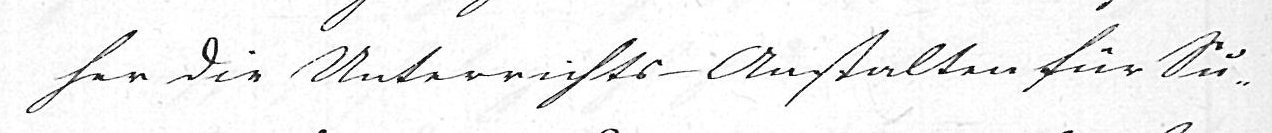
her die Unterrichts-Anstalten für Su-
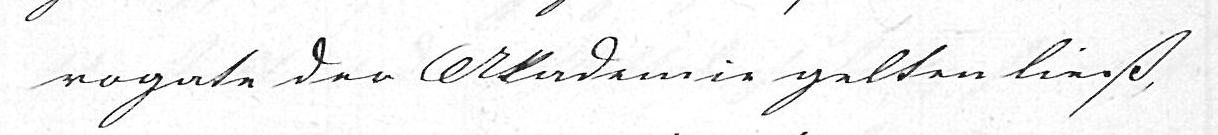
rogate der Akademie gelten ließ,
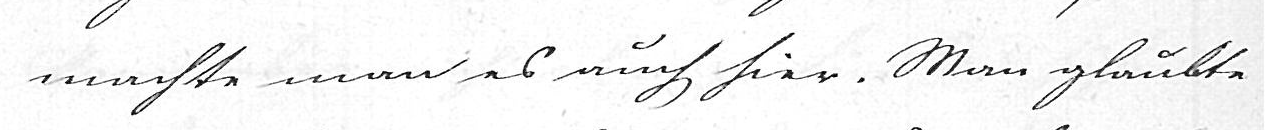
machte man es auch hier. Man glaubte
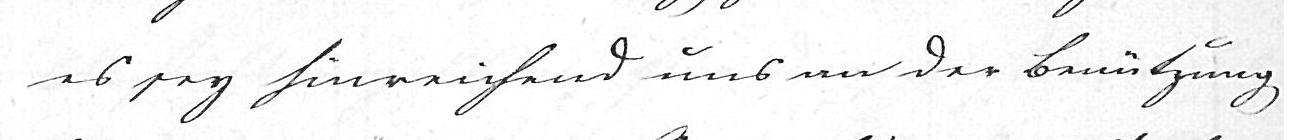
es sey hinreichend uns an der Benützung
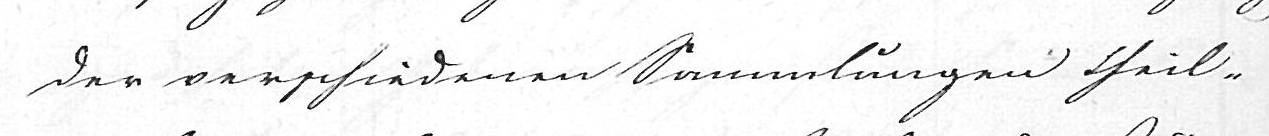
der verschiedenen Samlungen theil-
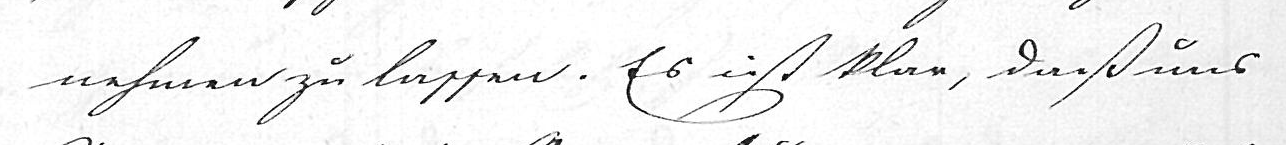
nehmen zu lassen. Es ist klar, daß und
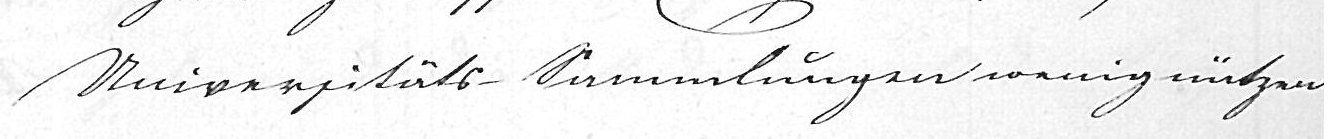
Universität-Sammlungen wenig nützen
